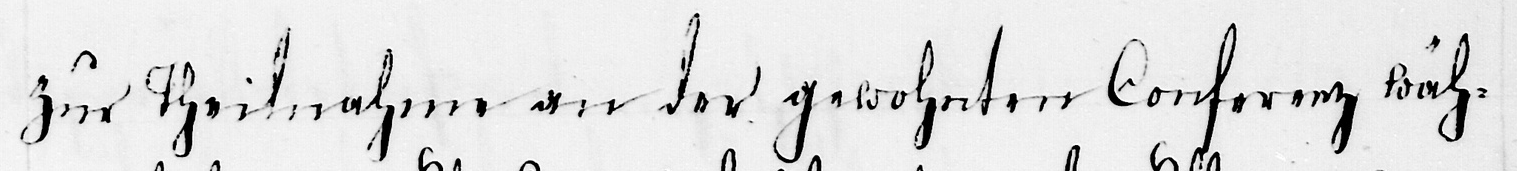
zur Theilnahme an der gewohnten Conferenz wäh¬
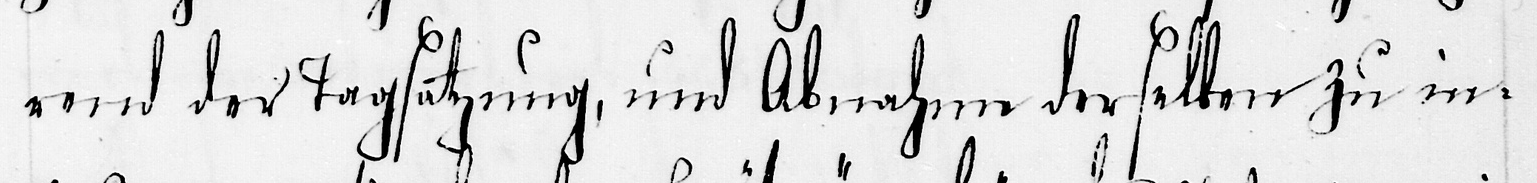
rend der Tagsatzung, und Abnahme derselben zu in¬
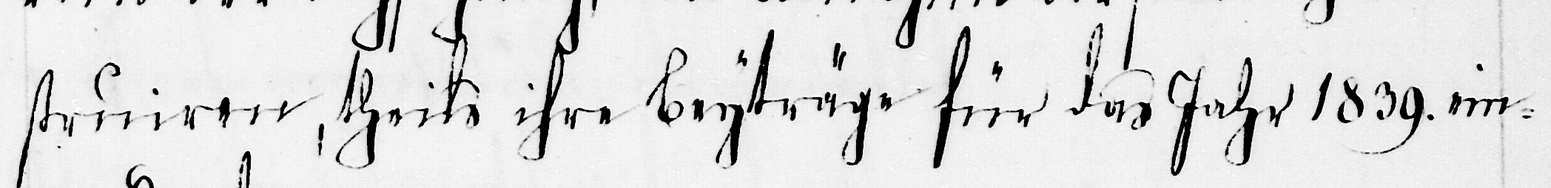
struiren, theils ihre Beyträge für das Jahr 1839. ein¬
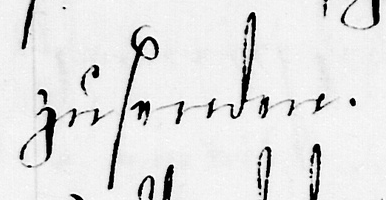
zusenden.
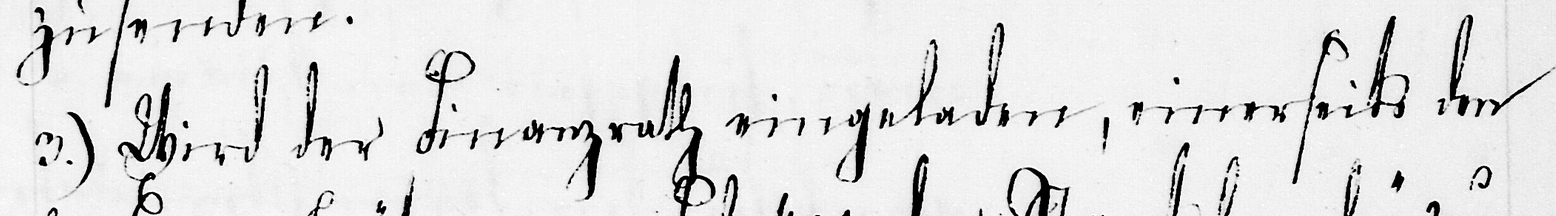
3.) Wird der Finanzrath eingeladen, einerseits den
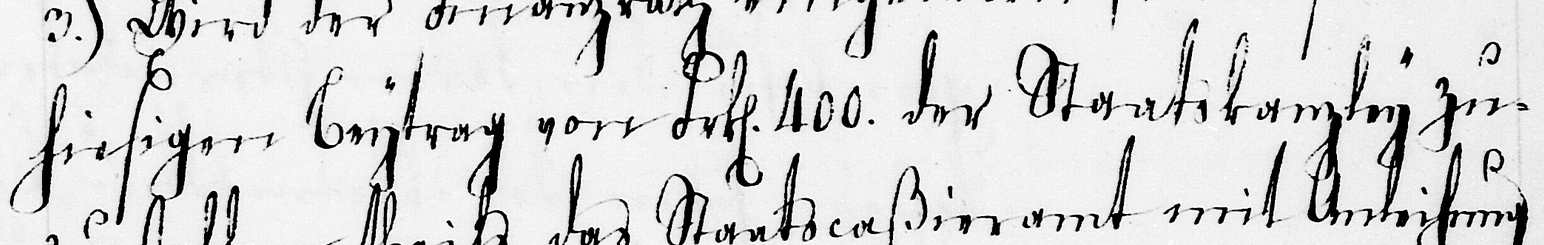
hiesigen Beytrag von Frk[en]. 400. der Staatskanzley zu¬
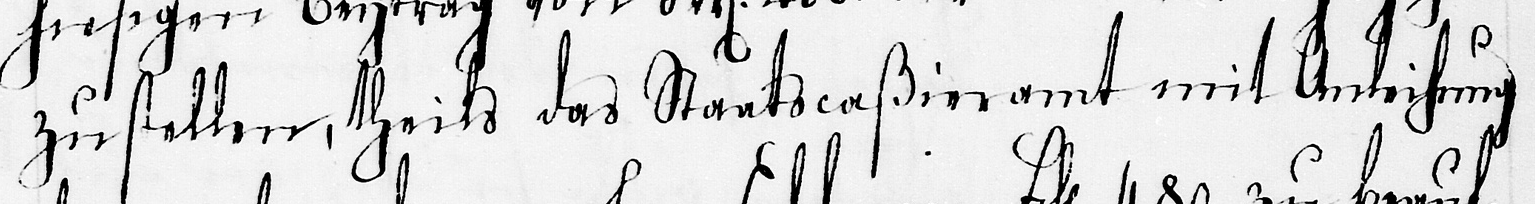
zustellen, theils das Staatscaßieramt mit Anleihung
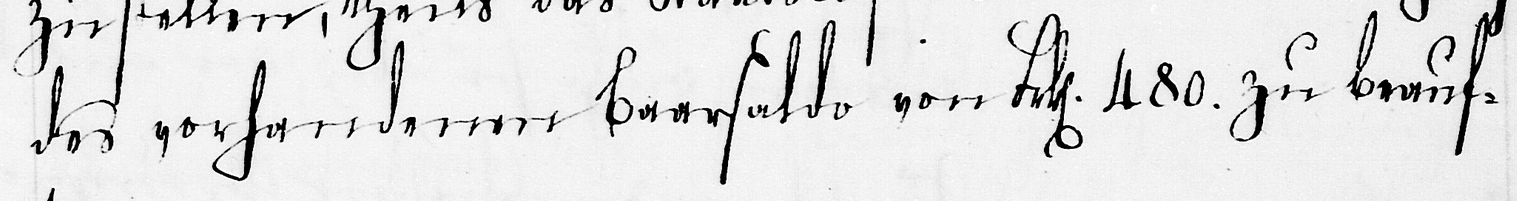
des vorhandenen Baarsaldo von Frk[en]. 480. zu beauf¬
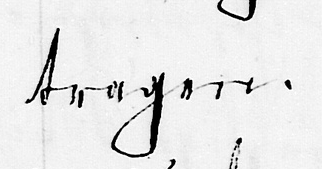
tragen.
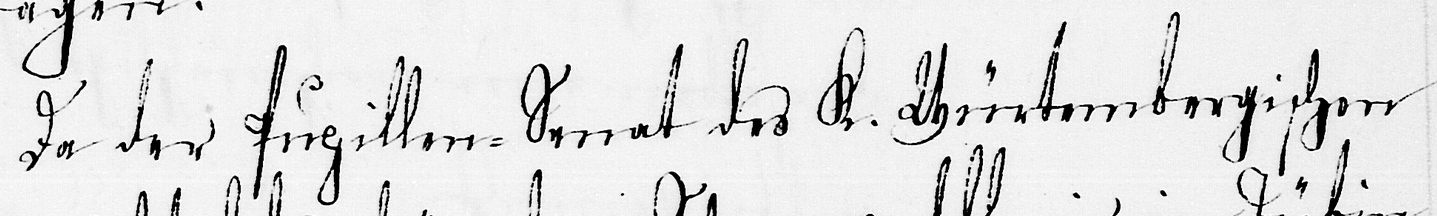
Da der Pupillen-Senat des K. Würtembergischen
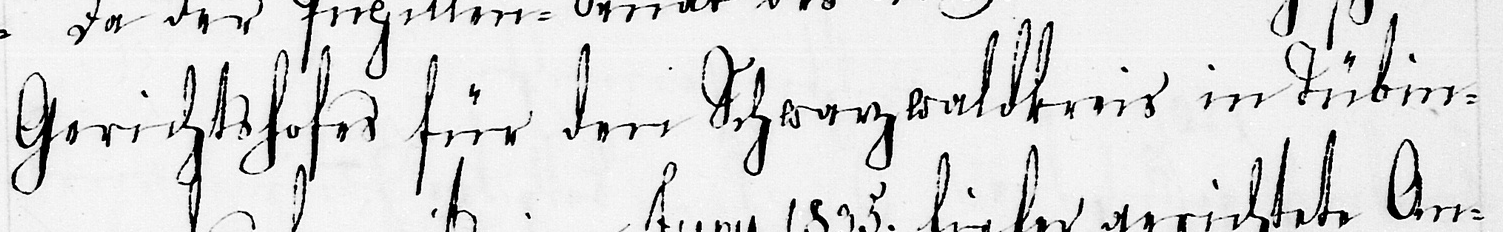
Gerichtshofes für den Schwarzwaldkreis in Tübin¬
